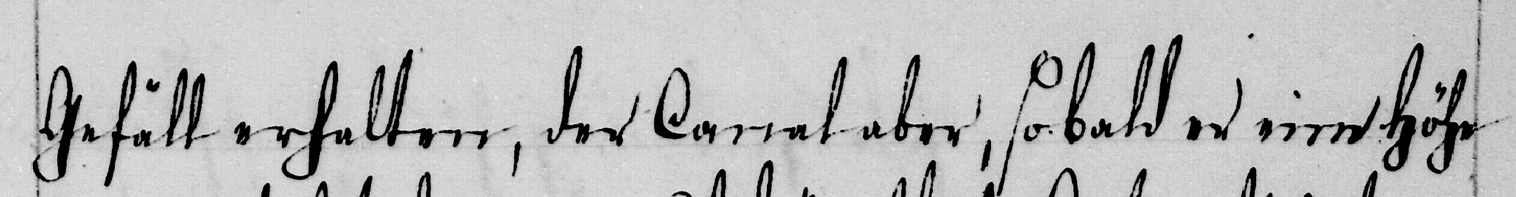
Gefälle erhalten, der Canal aber, sobald er eine Höhe
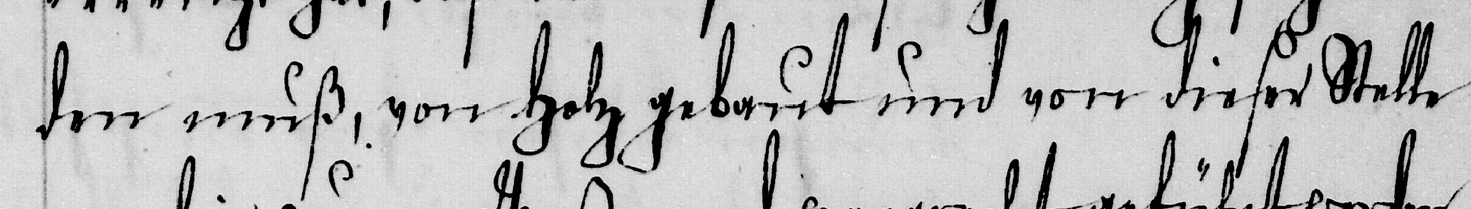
den muß, von Holz gebaut und von dieser Stelle
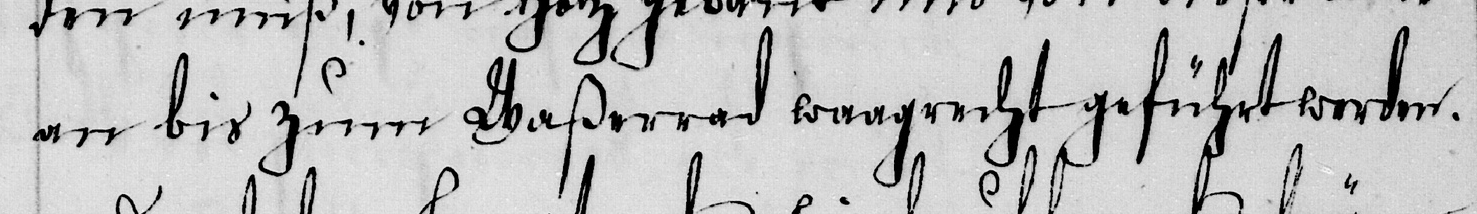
an bis zum Waßerrad waagrecht geführt werden.
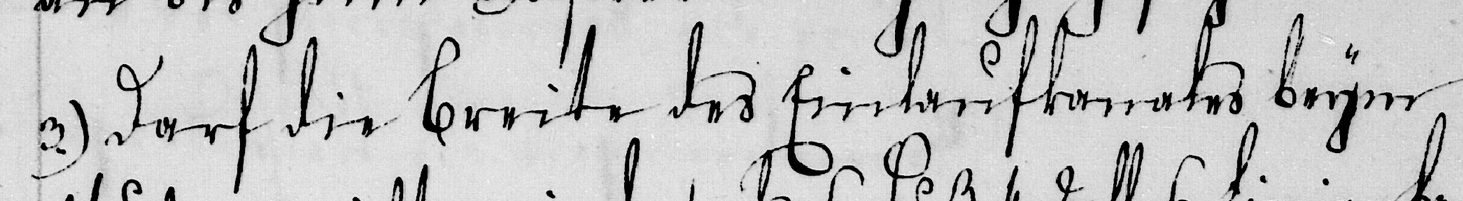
3.) Darf die Breite des Einlaufkanales beym
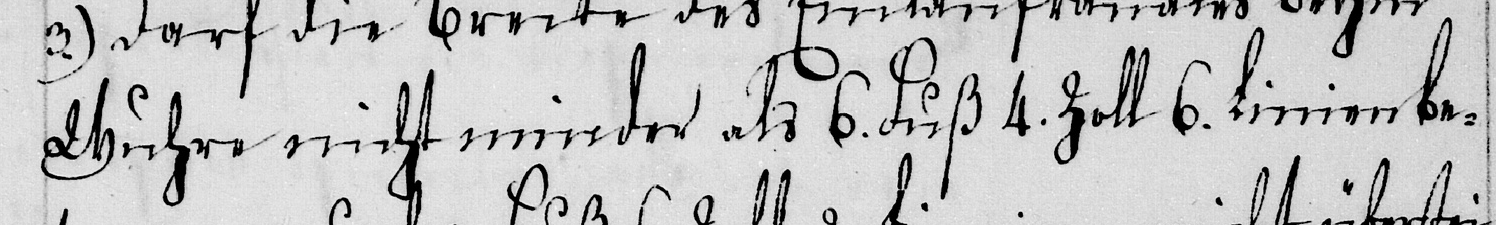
Wuhre nicht minder als 6. Fuß 4. Zoll 6. Linien be¬
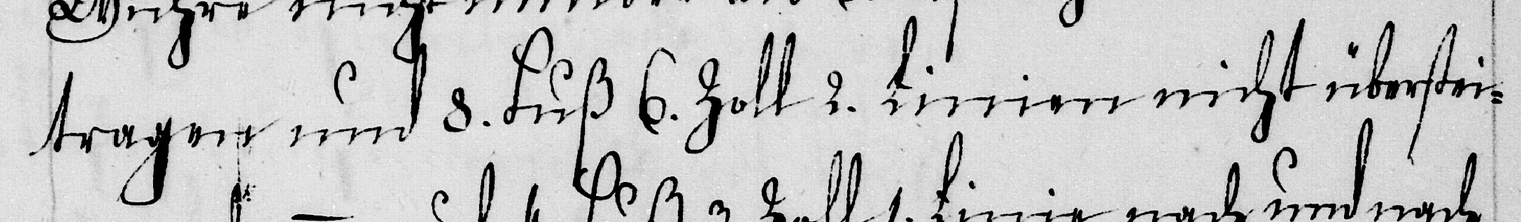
tragen und 8. Fuß 6. Zoll 2. Linien nicht überstei¬
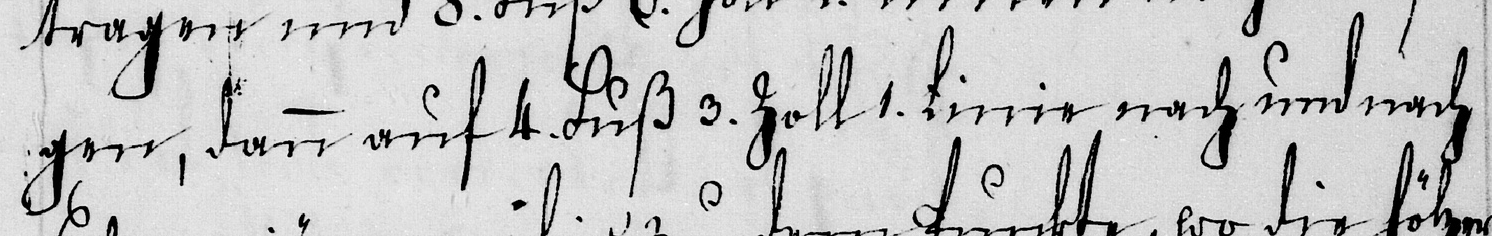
gen, dann auf 4. Fuß 3. Zoll 1. Linie nach und nach
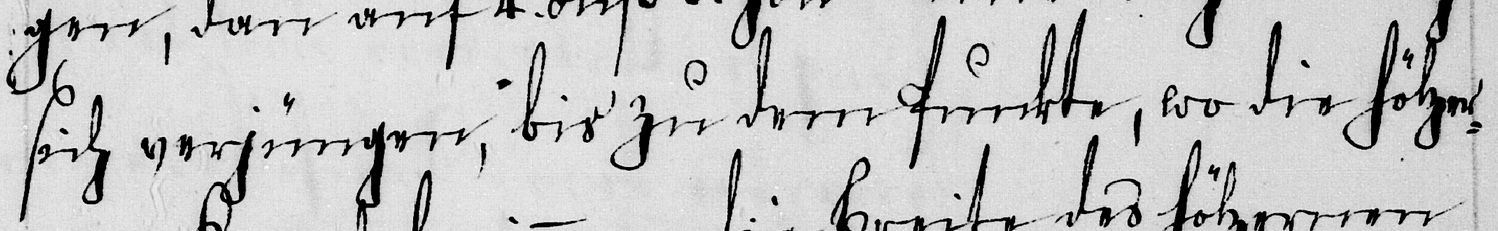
sich verjüngen, bis zu dem Punkte, wo die hölze¬
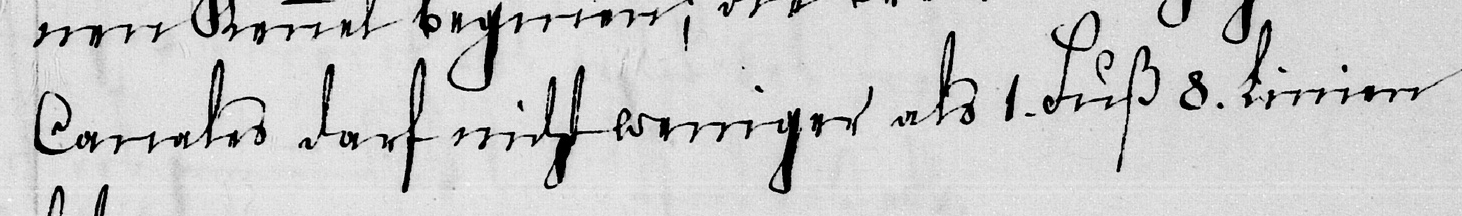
Canales darf nicht weniger als 1. Fuß 8. Linien
